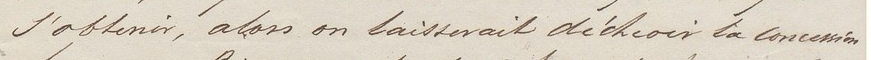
s'obtenir, alors on laisserait déchoir la Concession
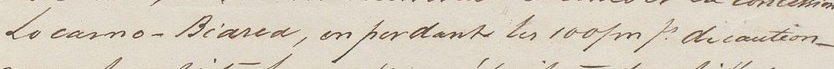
Locarno–Biasca, en perdant les 100/m fs de caution-
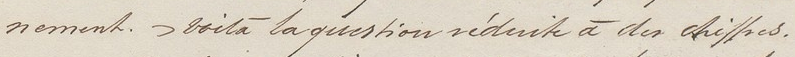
nement. – Voilà la question réduite à des chiffres.
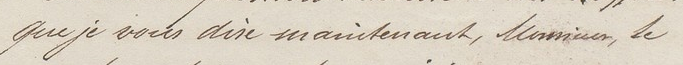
Que je vous dise maintenant, Monsieur, le
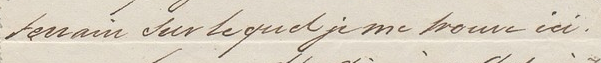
terrain sur lequel je me trouve ici.
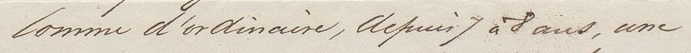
Comme d'ordinaire, depuis 7 à 8 ans, une
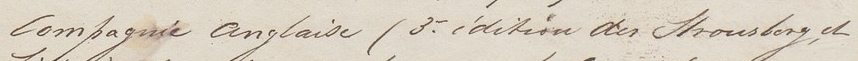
Compagnie anglaise (3e édition des Strousberg, et
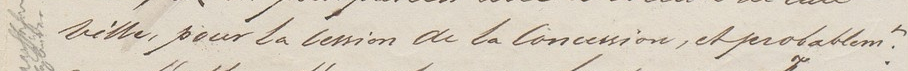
Ville, pour la cession de la Concession, et probablemt
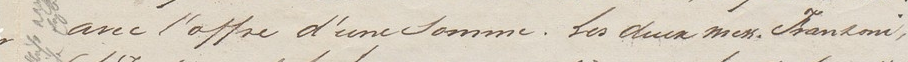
avec l'offre d'une somme. Les deux Mess. Franzoni,
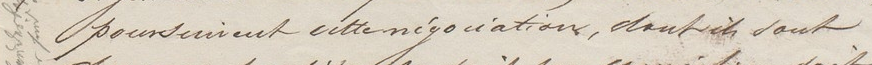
poursuivent cette négociation, dont ils sont
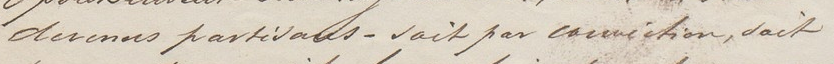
devenus partisans – soit par conviction, soit
